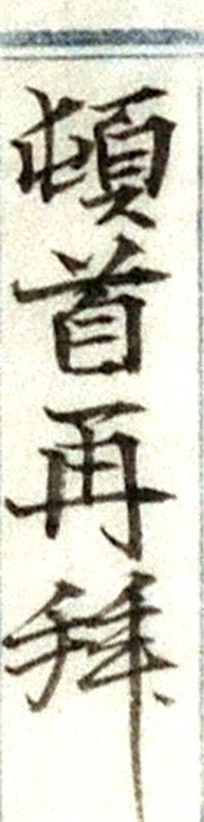頓首再拝

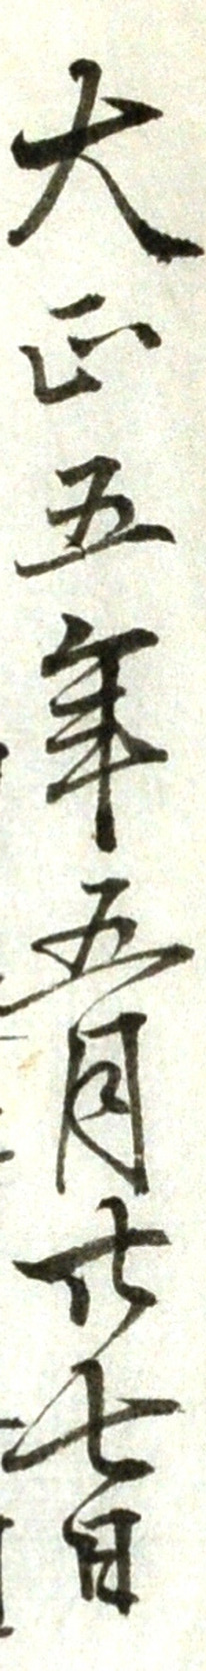大正五年五月廿七日
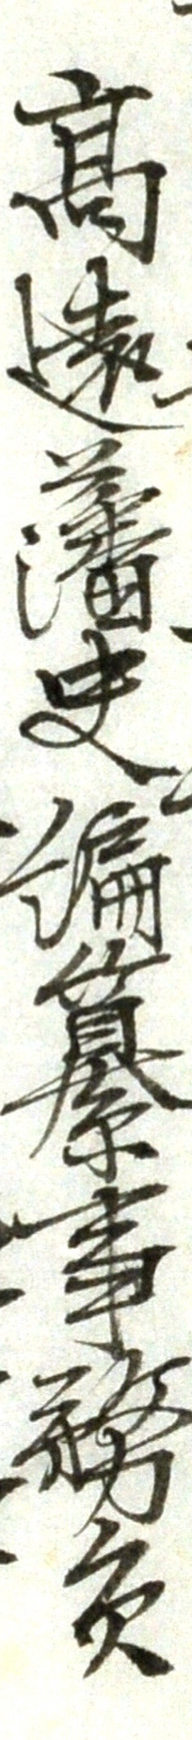高遠藩史編纂事務員
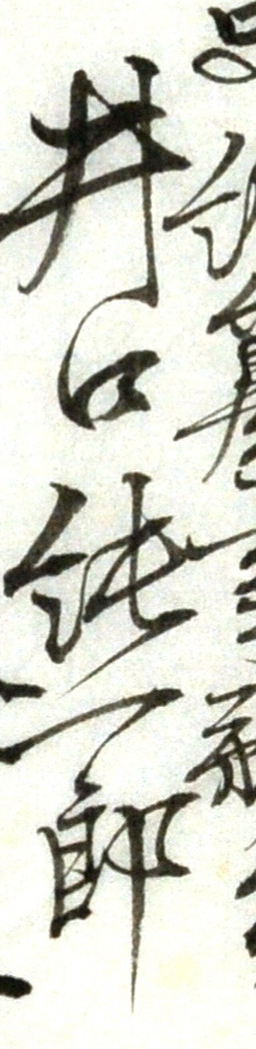井口純一郎
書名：高遠藩執政ニ提出セシ建議書
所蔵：伊那市立高遠町図書館・合同会社AMANE
